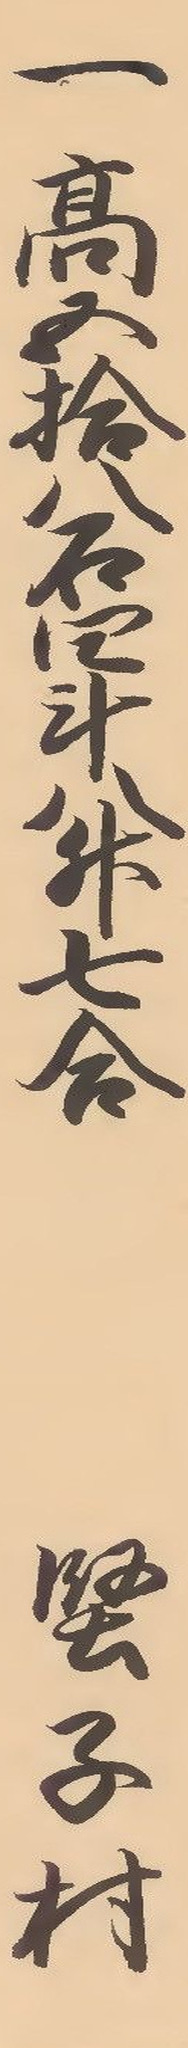一高五拾八石四斗八升七合堅子村
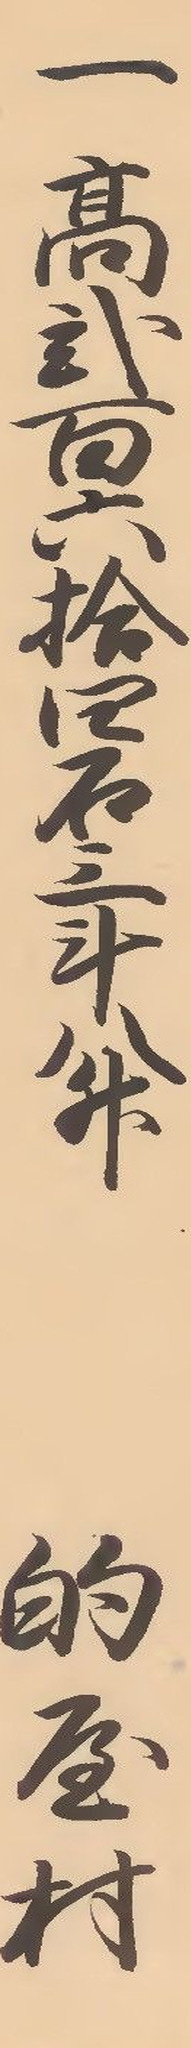一高弐百六拾四石三斗八升的屋村
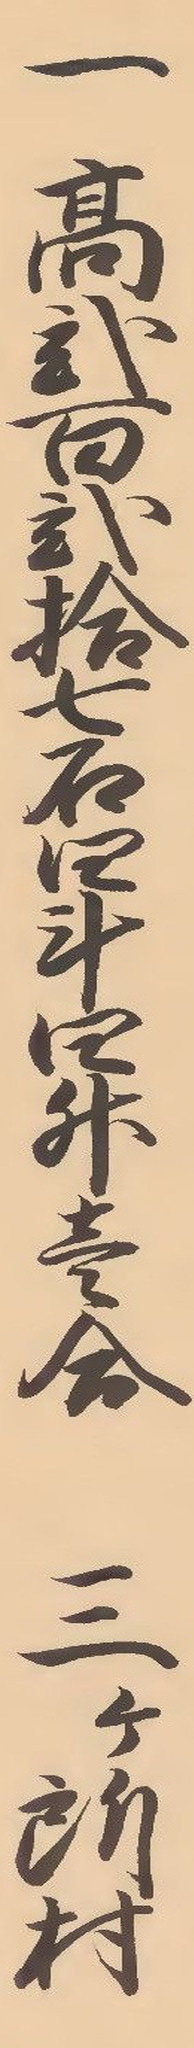一高弐百弐拾七石四斗四升壱合三ヶ所村

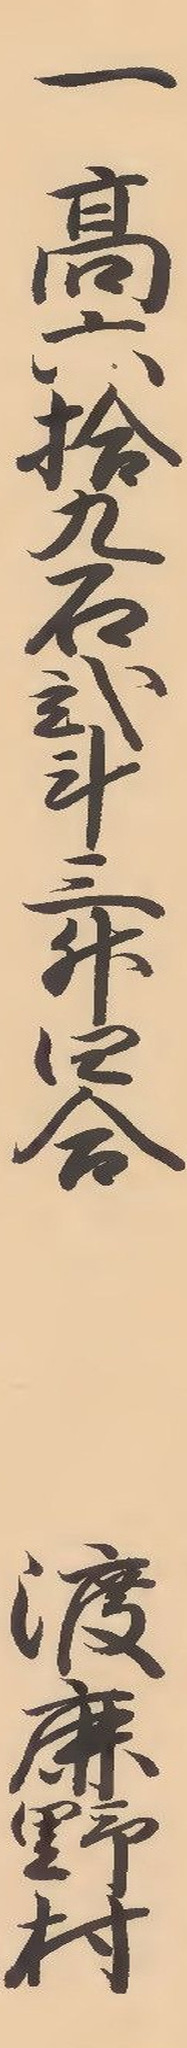一高六拾九石弐斗三升四合渡鹿野村
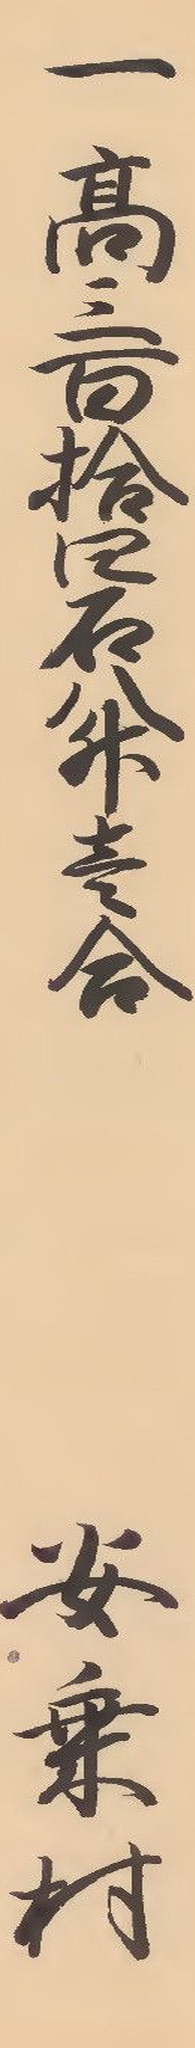一高三百拾四石八升壱合安乗村
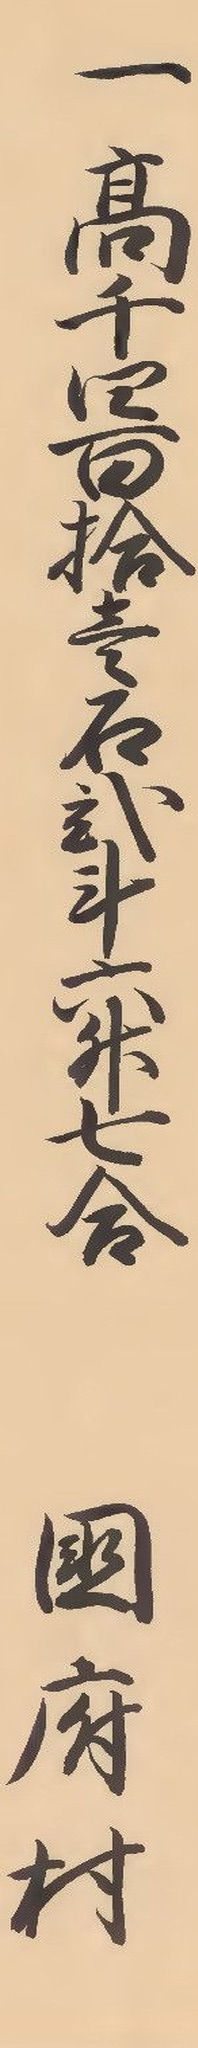一高千四百拾壱石弐斗六升七合国府村
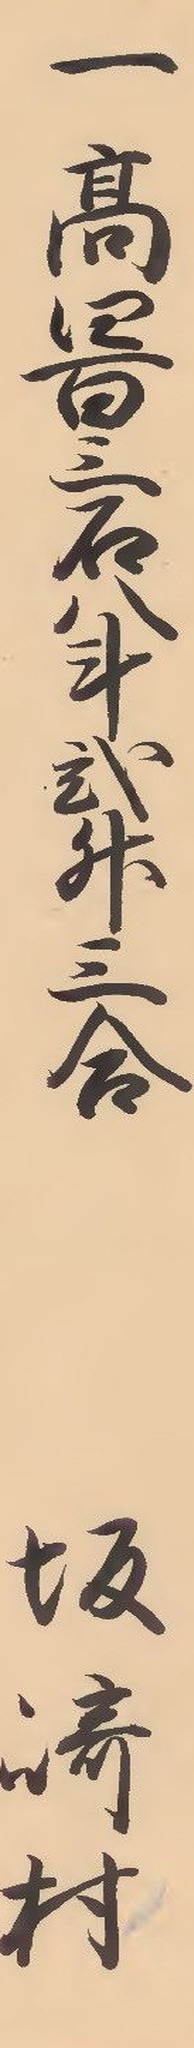一高四百三石八斗弐升三合坂崎村
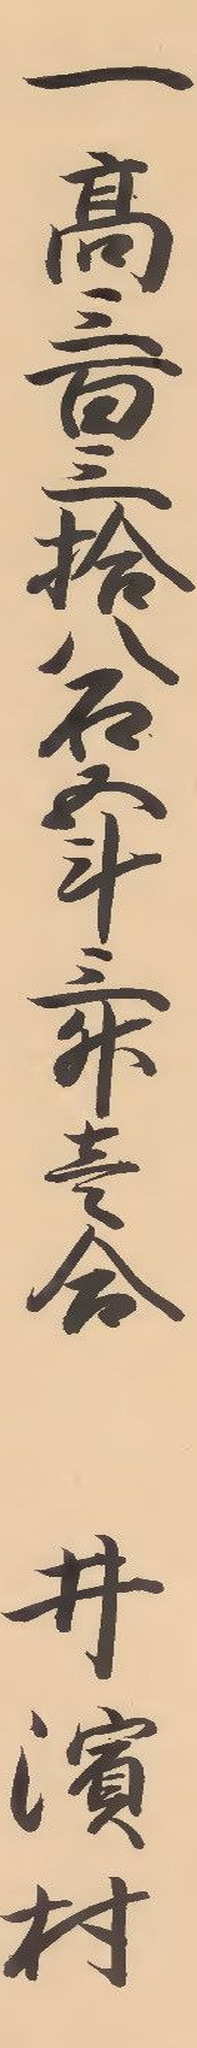一高三百三拾八石五斗三升壱合伊浜村
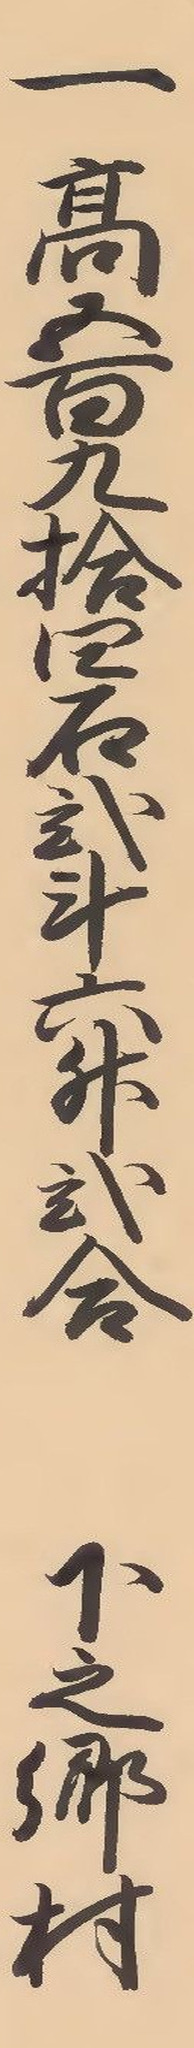一高五百九拾四石弐斗六升弐合下之郷村
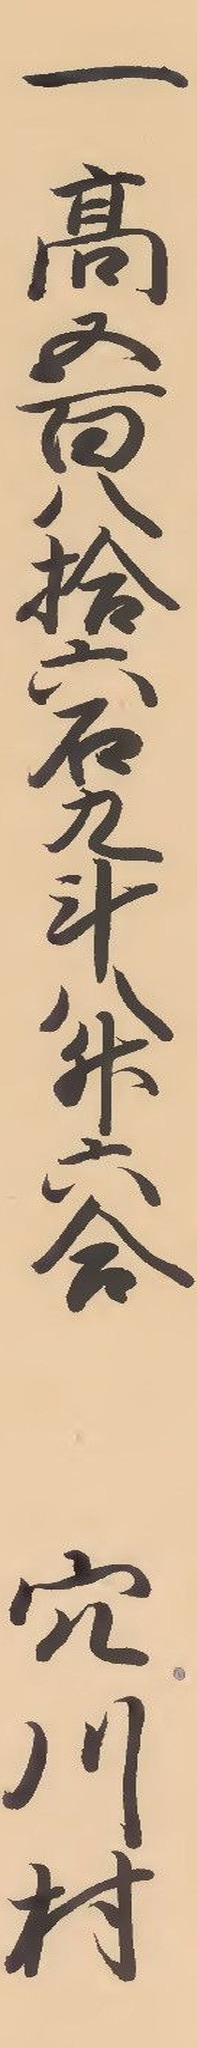一高五百八拾六石九斗八升六合穴川村
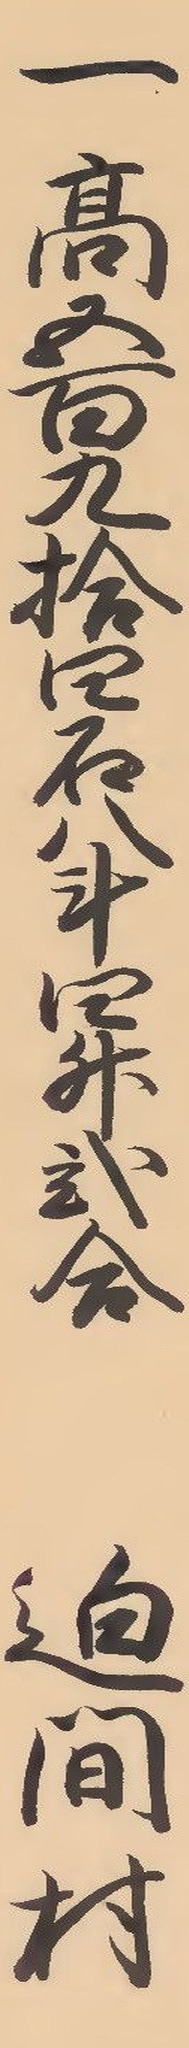一高五百九拾四石八斗四升弐合迫間村

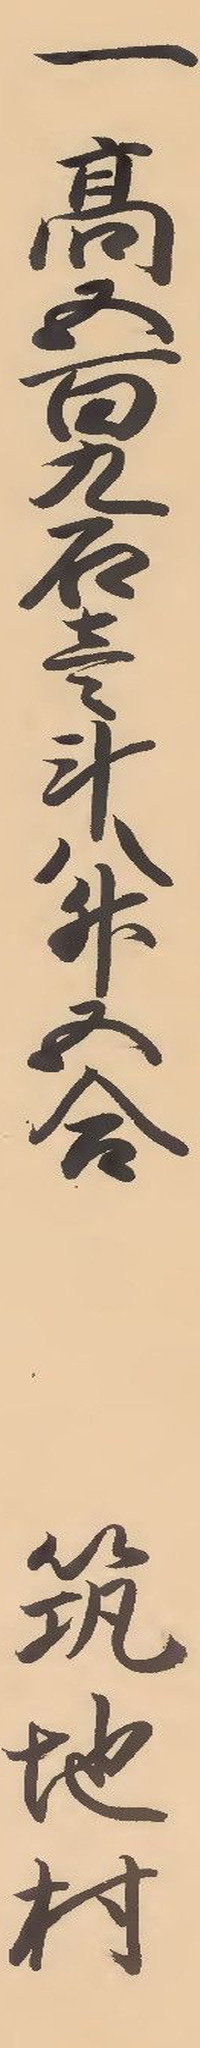一高五百九石壱斗八升五合筑地村
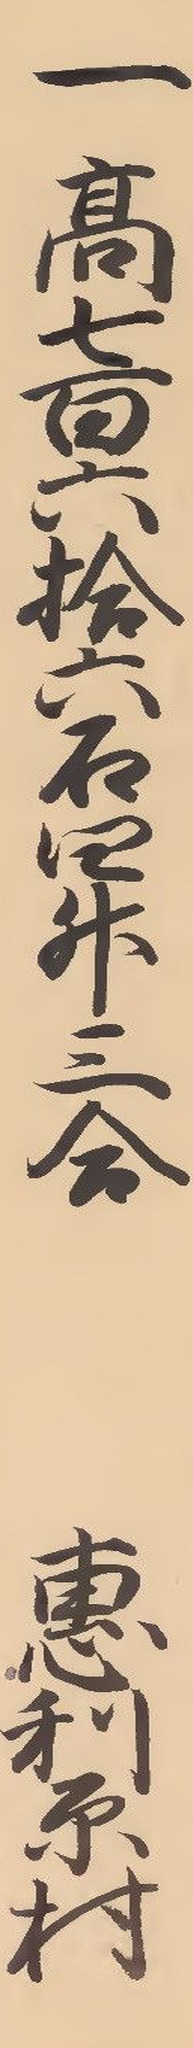一高七百六拾六石四升三合恵利原村
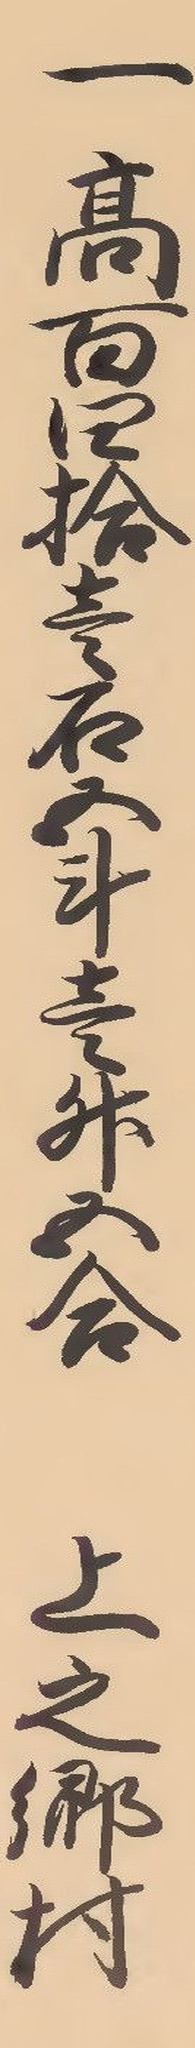一高百四拾壱石五斗壱升五合上之郷村
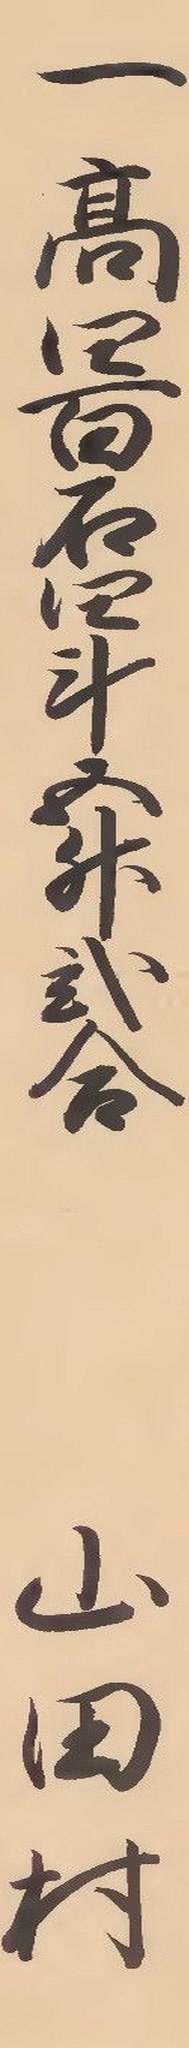一高四百石四斗五升弐合山田村
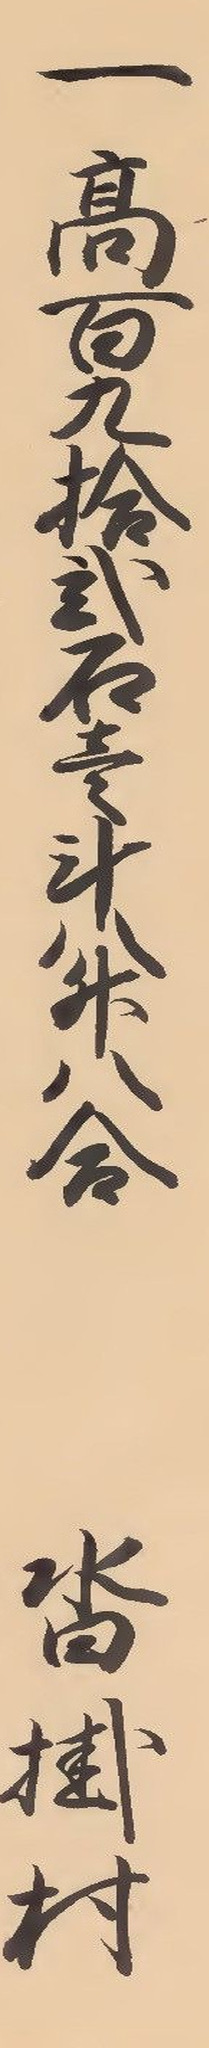一高百九拾弐石壱斗八升八合沓掛村
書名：志摩国郷帳
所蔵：国立公文書館 National Archives of Japan
